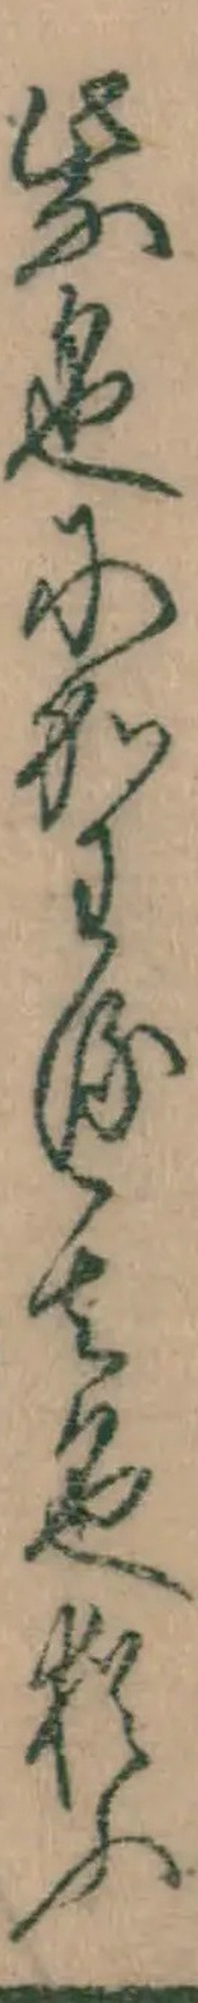紫色にかわる其色猶ふ
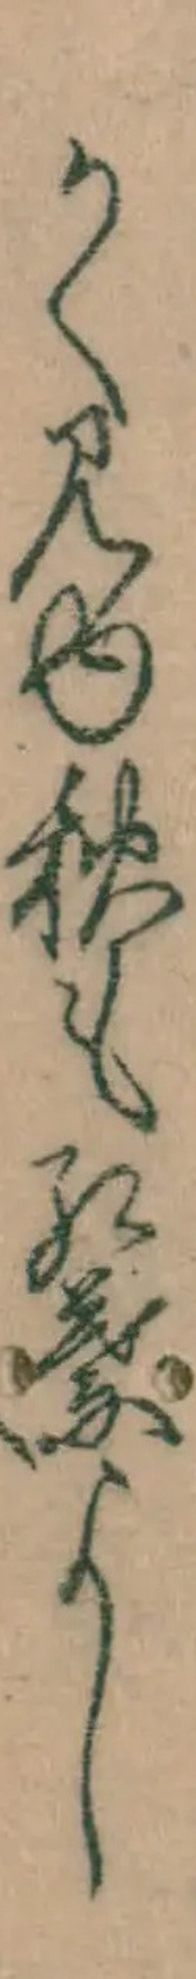かく見ゆ秋も紅葉よし
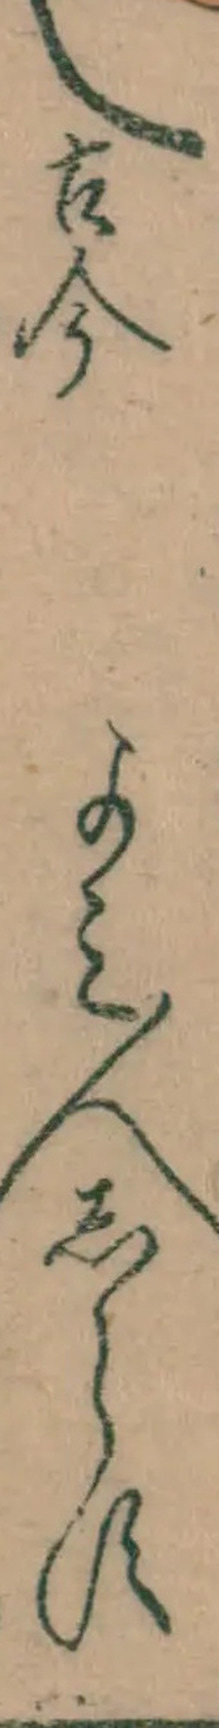古今よみ人しらす
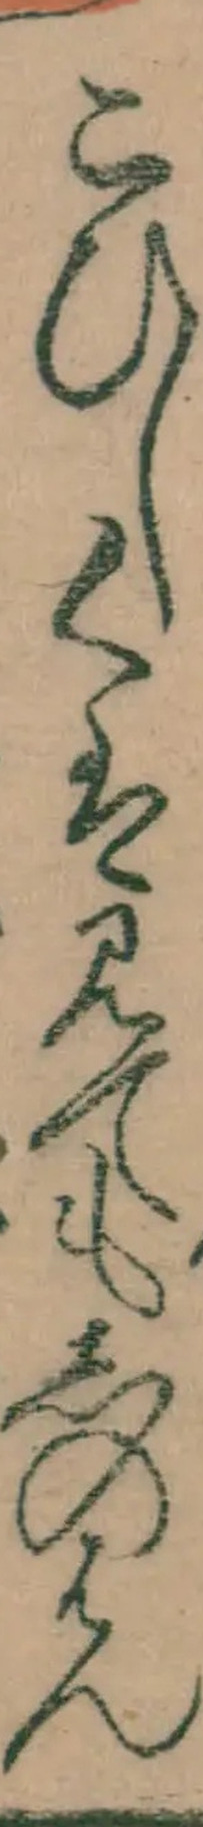こひしくは見てもしのはん
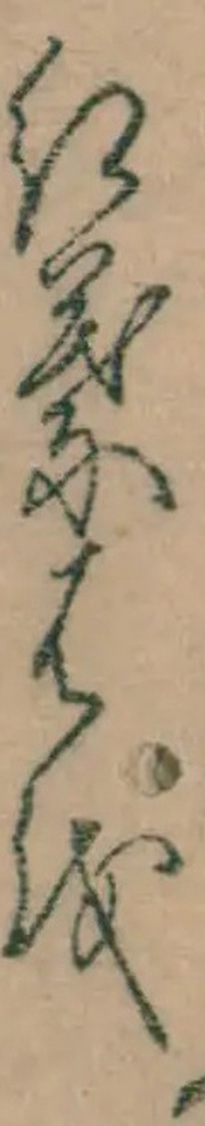紅葉はを
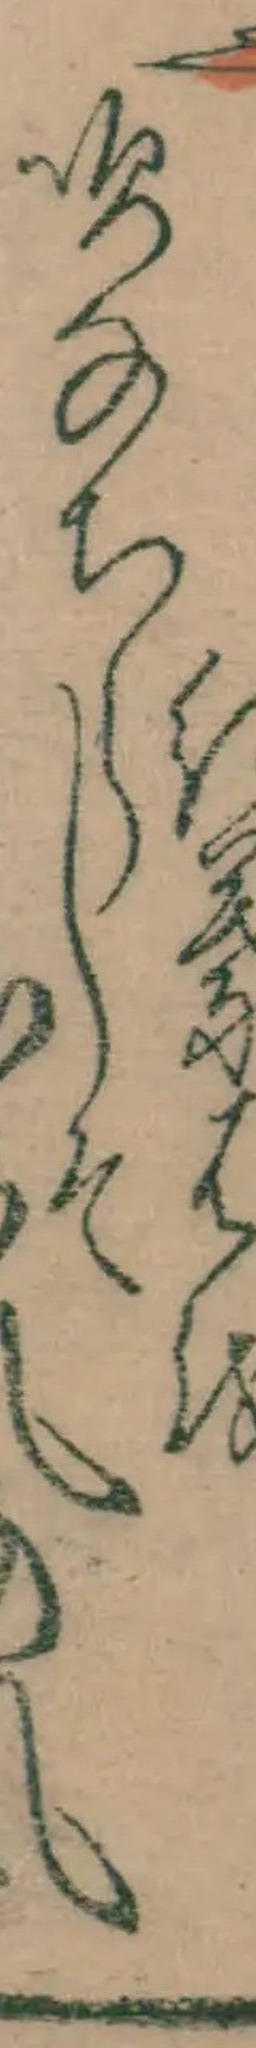吹なちらしそ
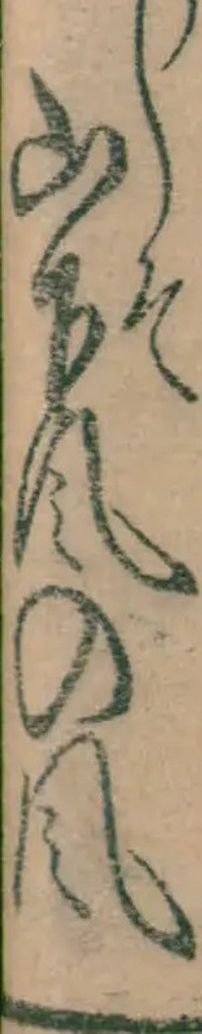山下風の風
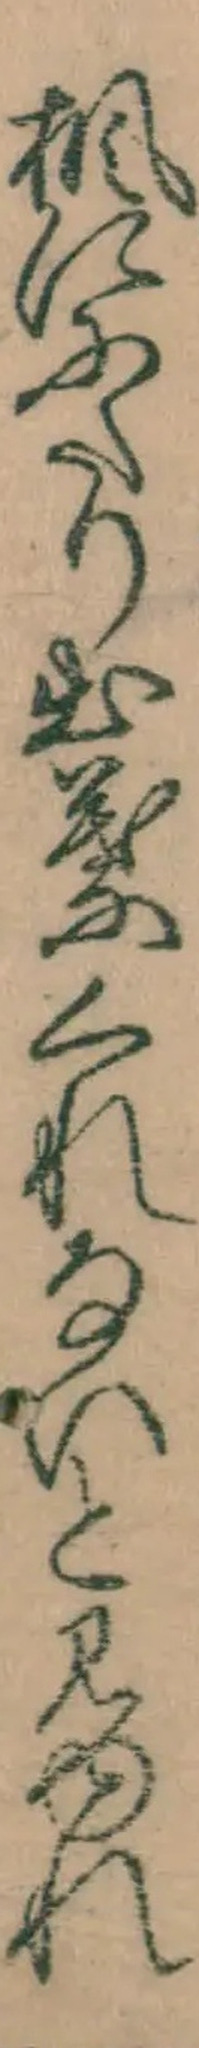楓ににたり出葉くれないと見ゆれ
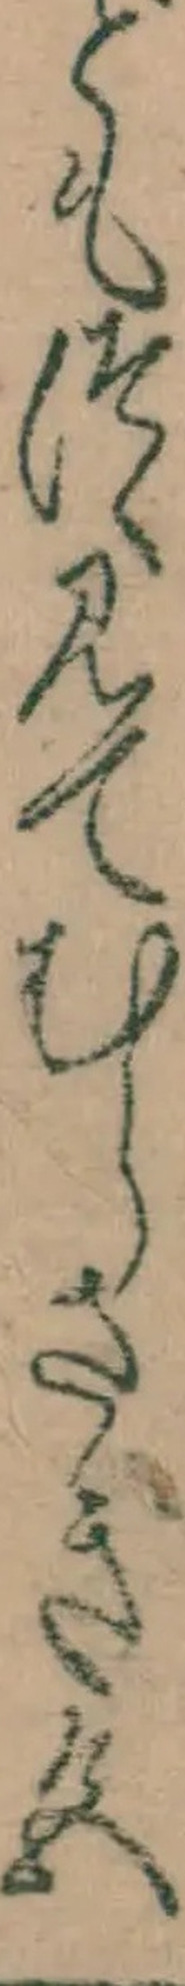どもつゝみてむらさき色
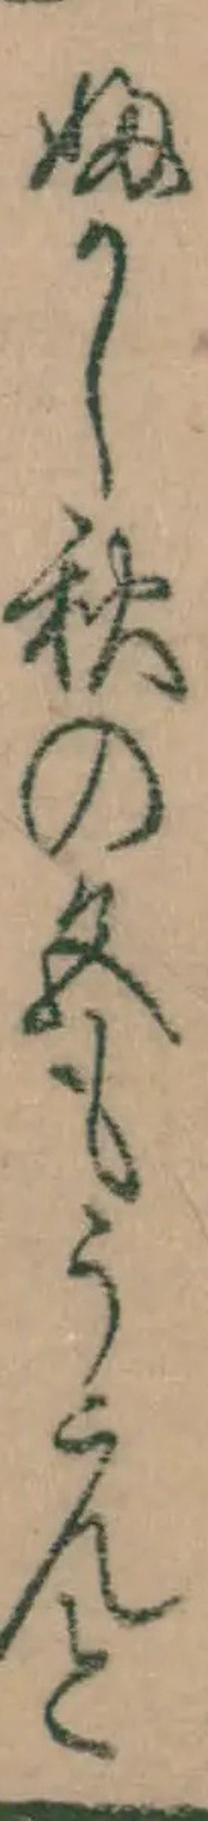ふかし秋の色もうこんと
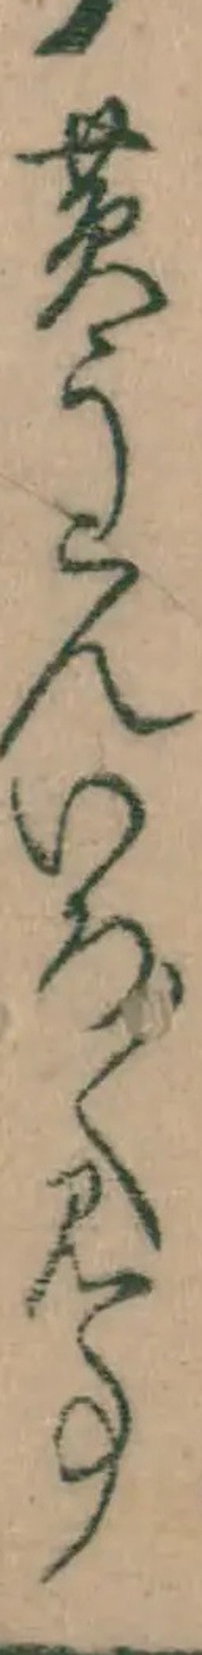黄うこんいろ〳〵見事
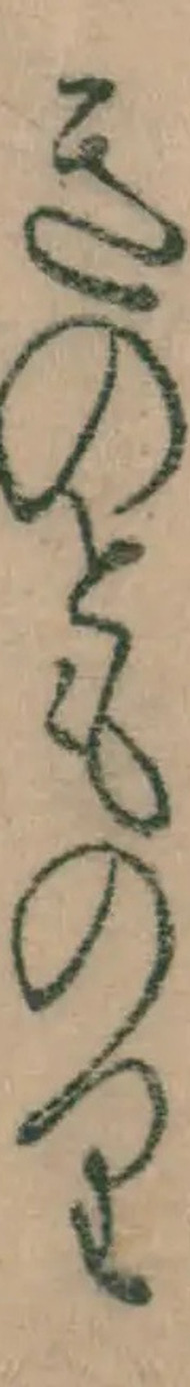きのとものり
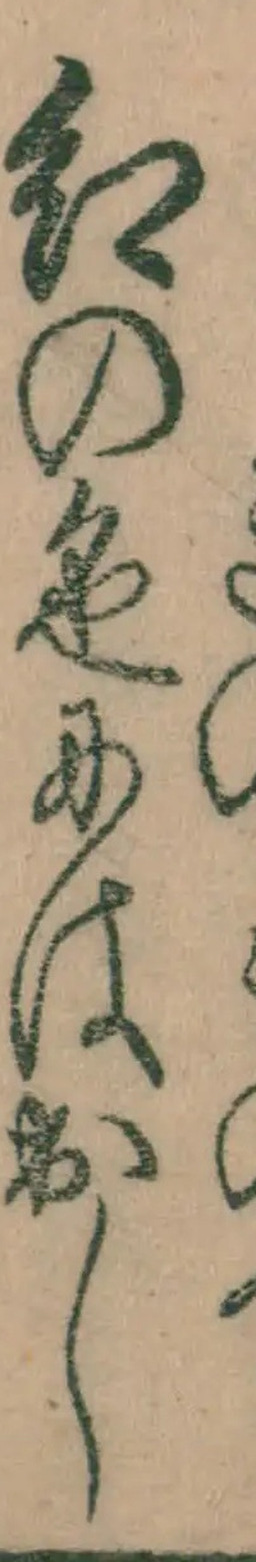紅の色には出し
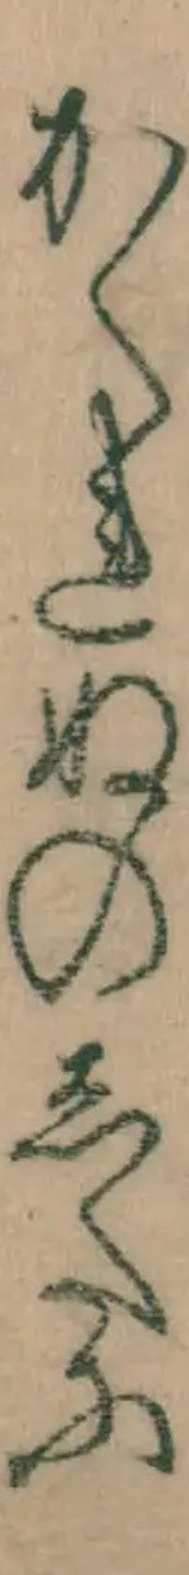かくれぬのしたに
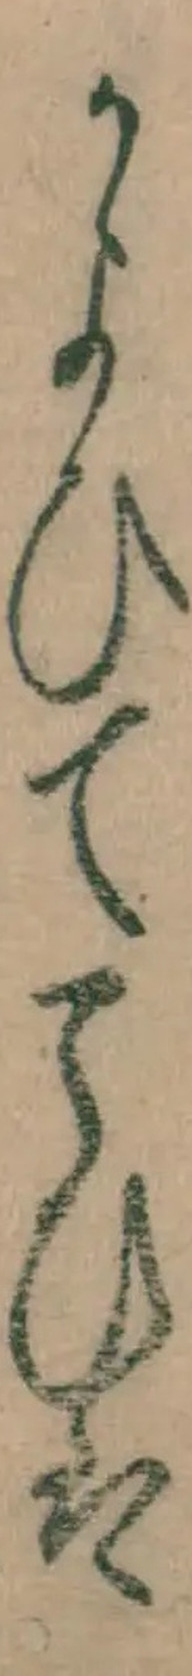かよひてこひは
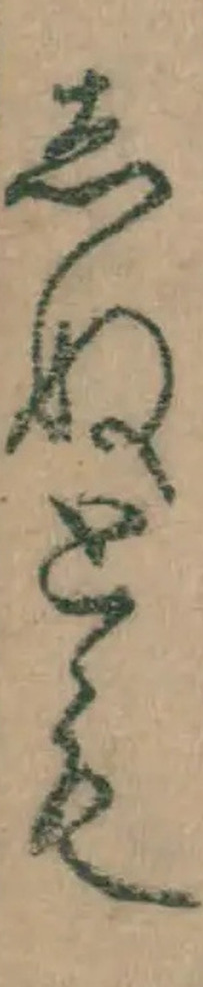しぬとも
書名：紅葉集
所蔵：国立国会図書館 National Diet Library, JAPAN
